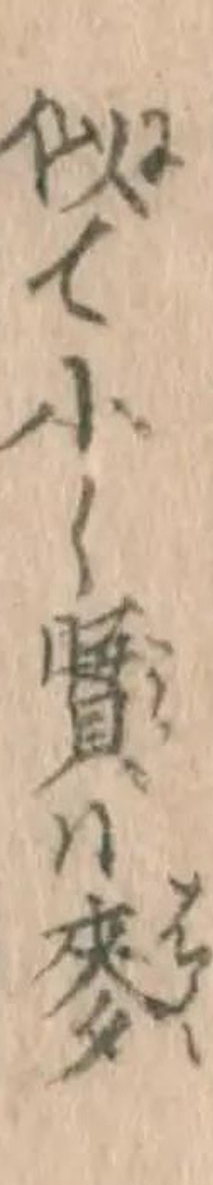似て小し実は麦
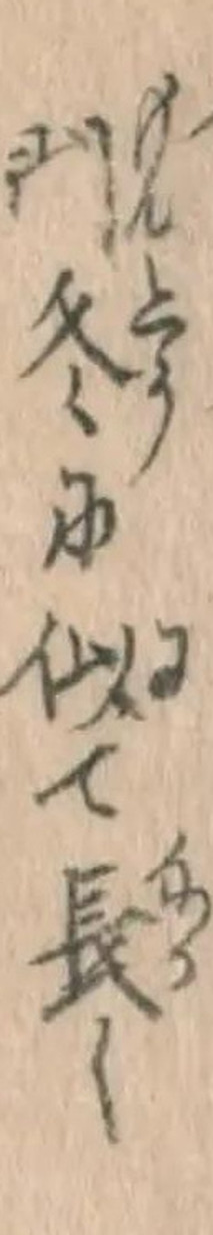門冬に似て長く
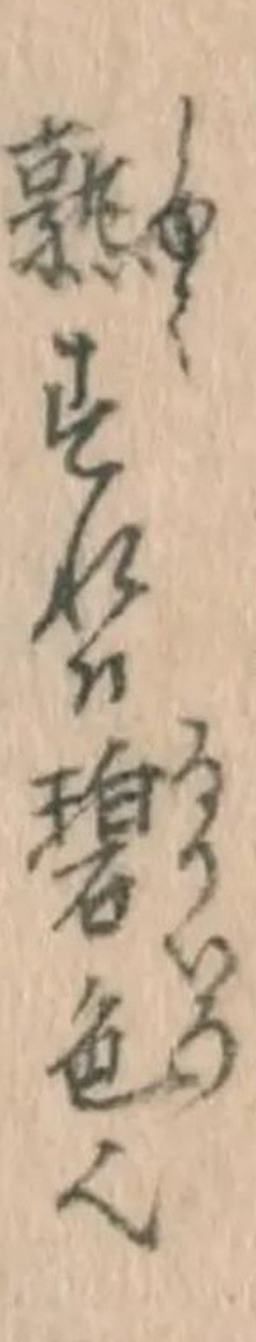熟すれは碧色也

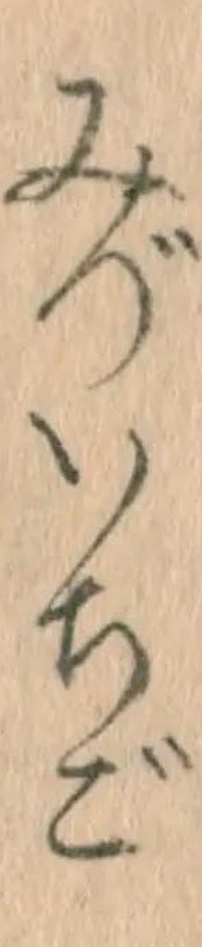みづいちご
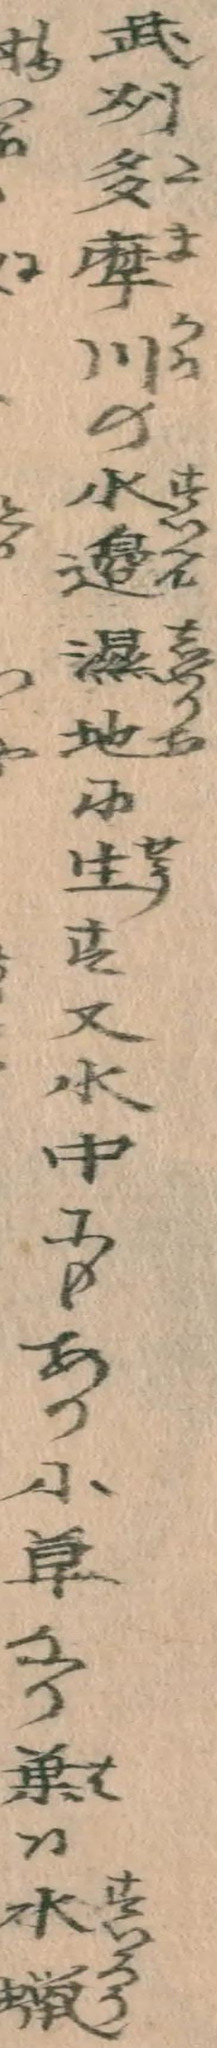武州多摩川の水辺湿地に生す又水中にもあり小草なり葉は水蠟
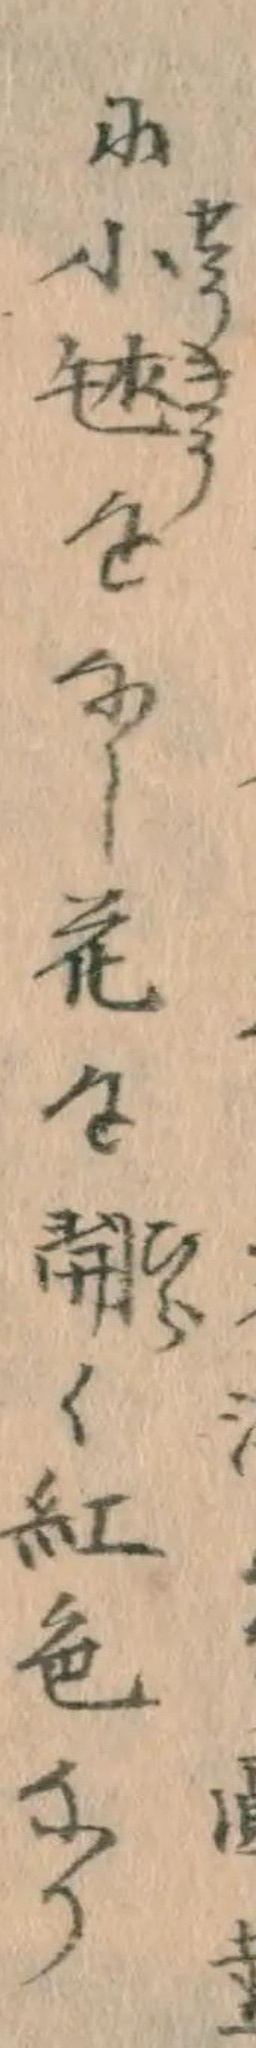に小毬をなし花を開く紅色なり
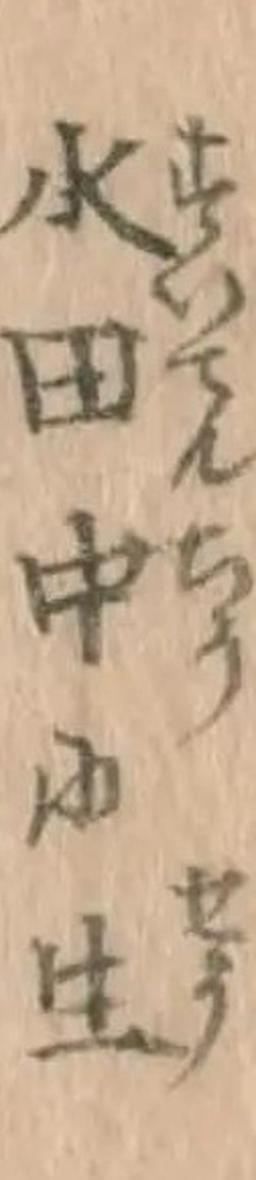水田中に生
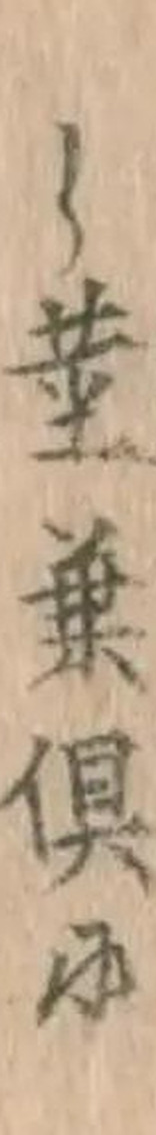し茎葉倶に
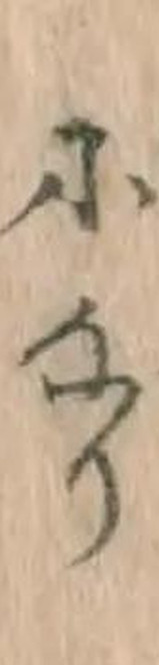小なり

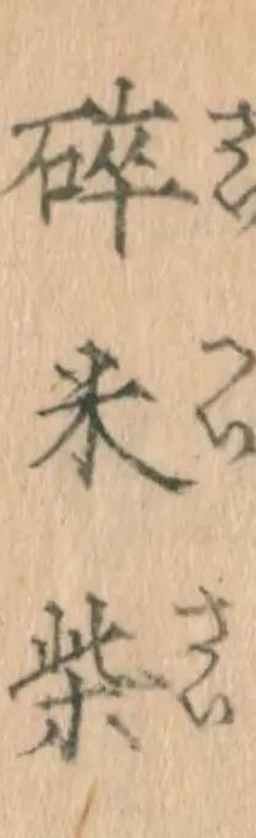砕米柴
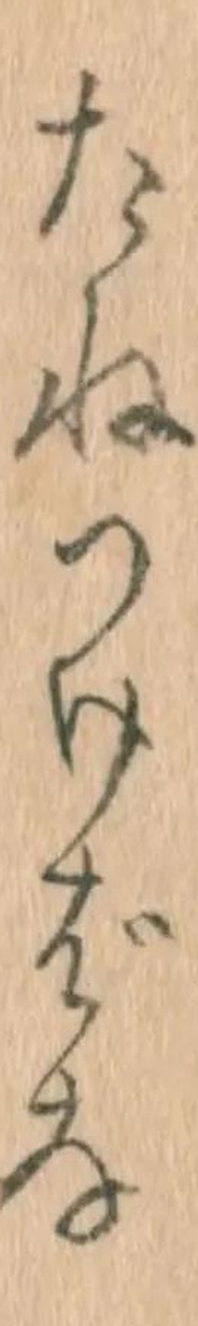たねつけばな
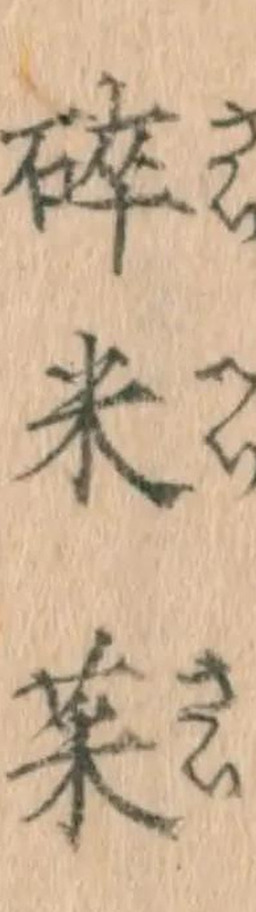砕米菜
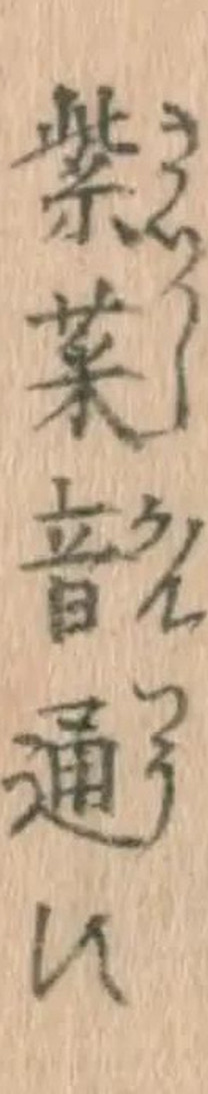紫菜音通す
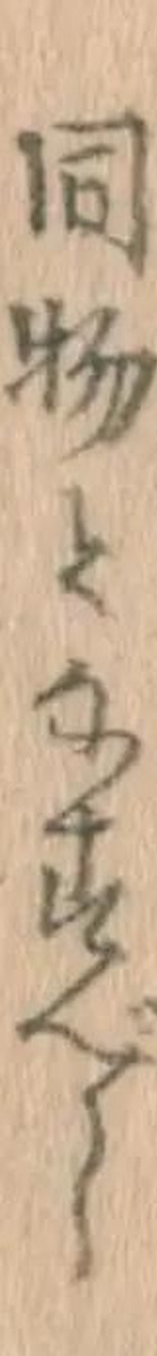同物となすべし
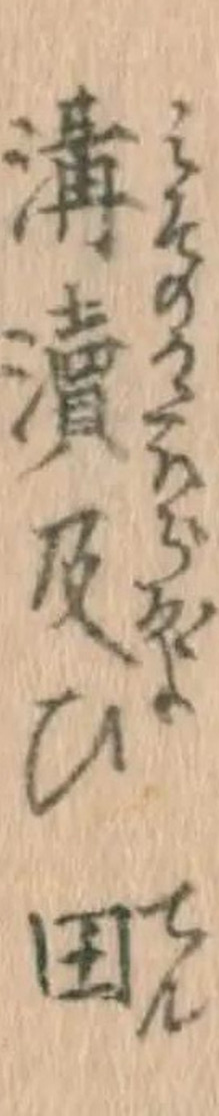溝瀆及ひ田
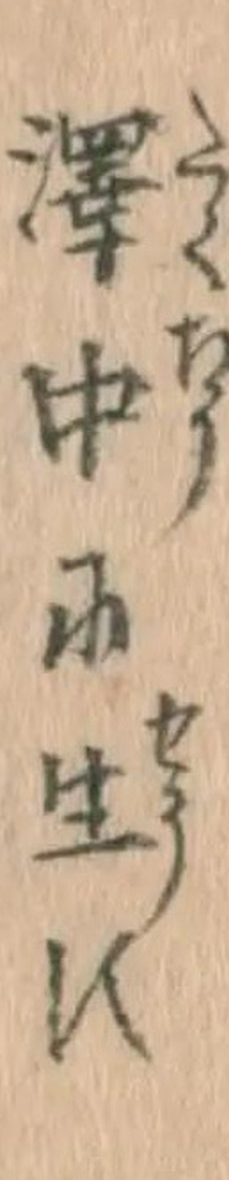沢中に生す
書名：本草図譜. 巻37-39
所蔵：国立国会図書館 National Diet Library, JAPAN
